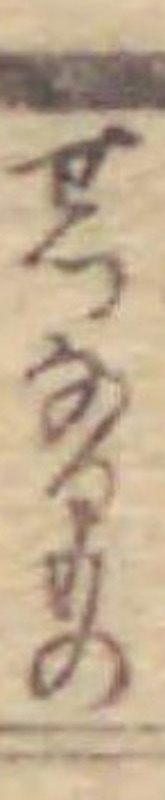せつなるもの
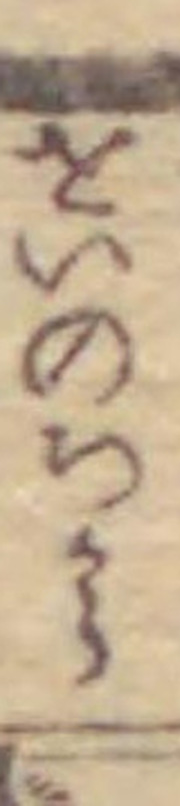をいのちから
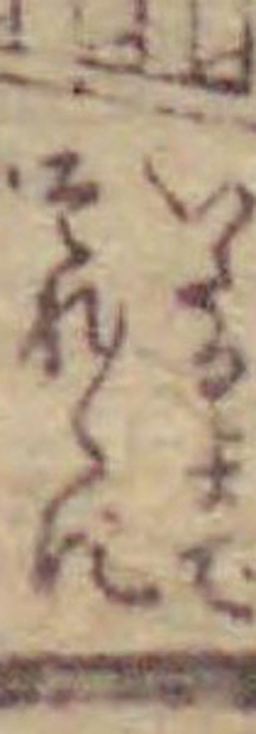それ〳〵に
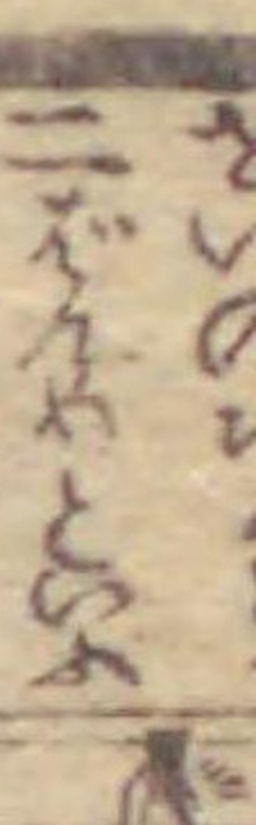二ばんめといふ
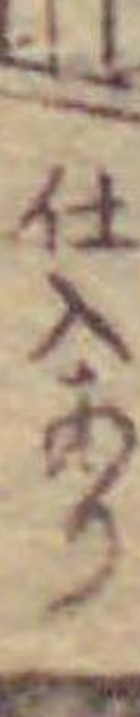仕入あり
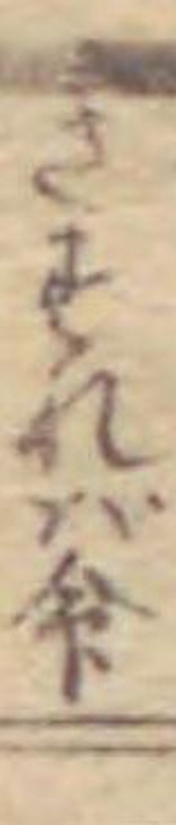さすれば命
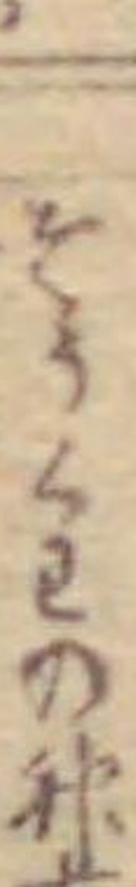そうくわの神古
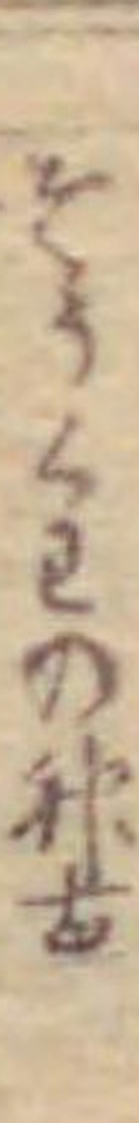そうくわの神古
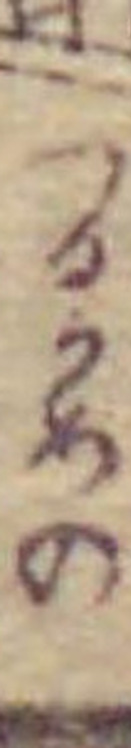つるかめの
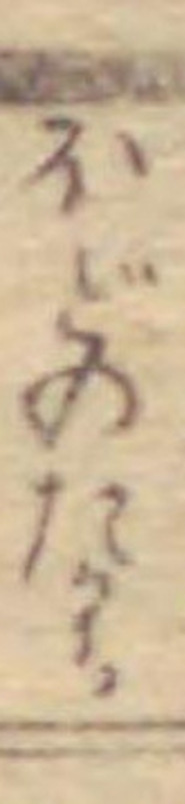ほどのたから
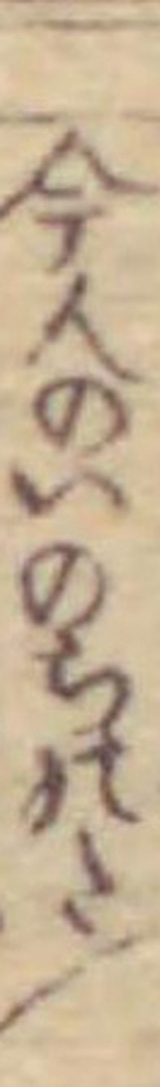今人のいのちのた
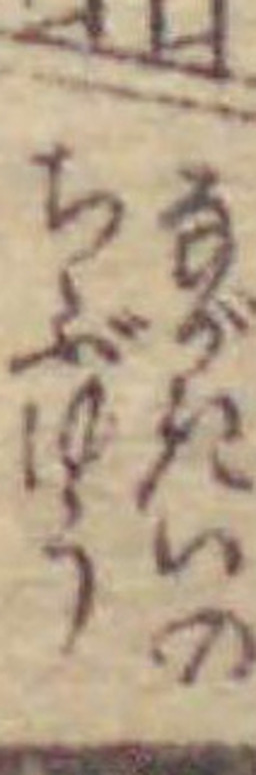ちぶゆう
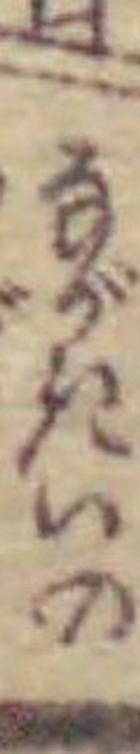ながきいの
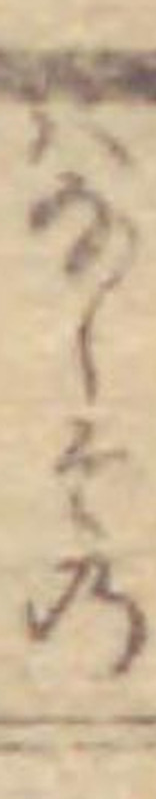はなしその
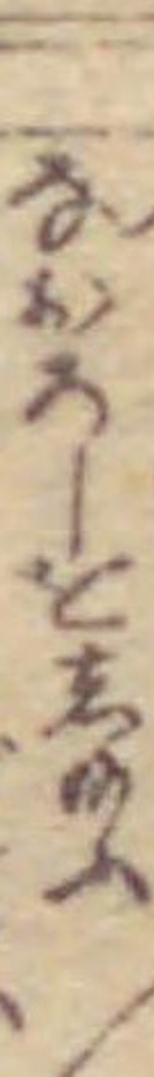なおろしをし給ふ
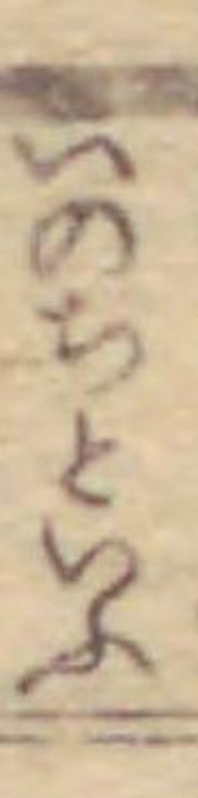いのちといふ
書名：御誂染長寿小紋 : 3巻
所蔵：国立国会図書館 National Diet Library, JAPAN
